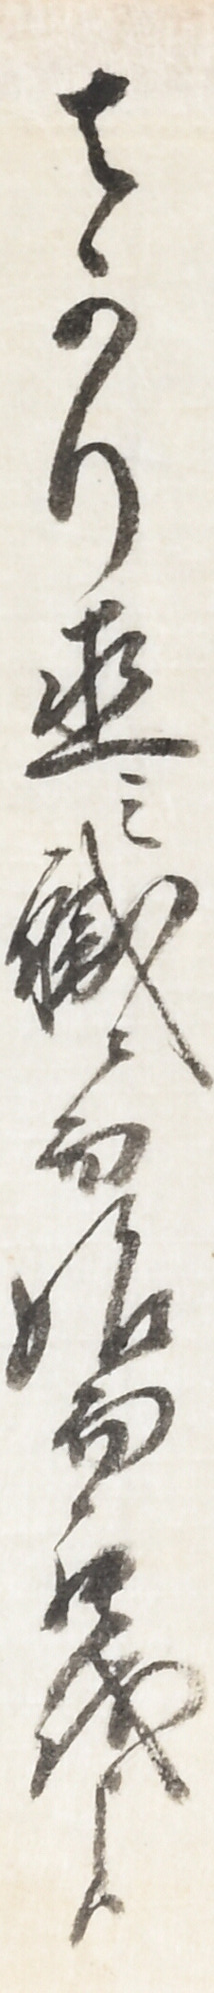はかり直シ職ニ而始而罷越申候
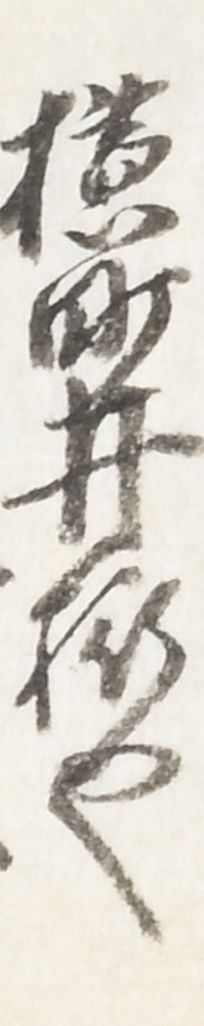横町井桁や
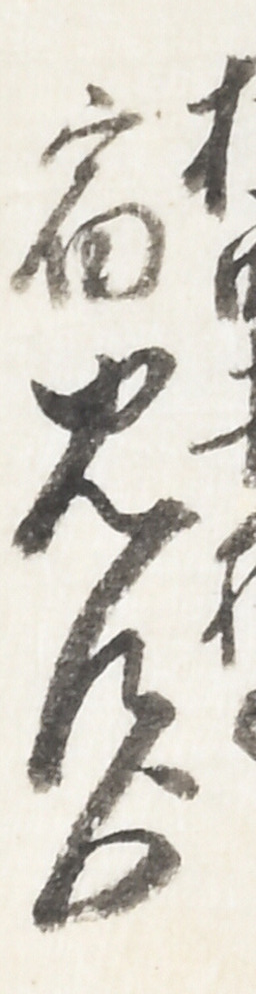宿忠左衛門
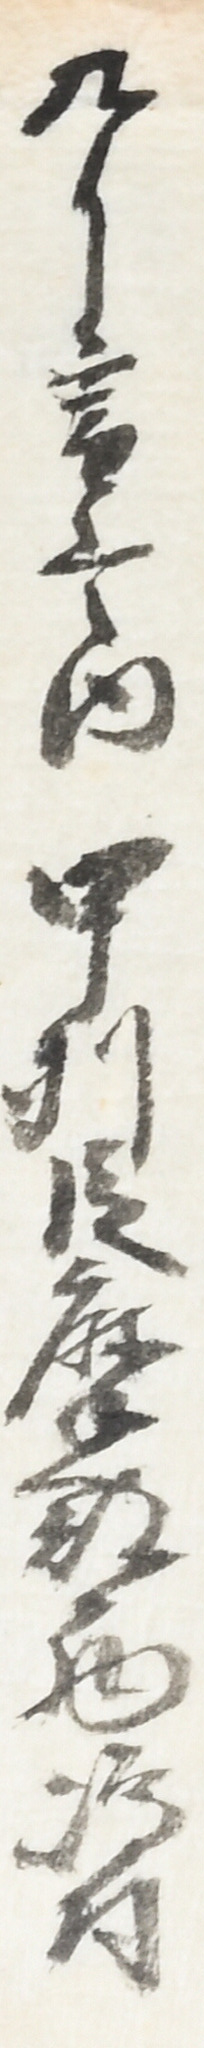九月書上之内甲州巨摩郡西嶋村
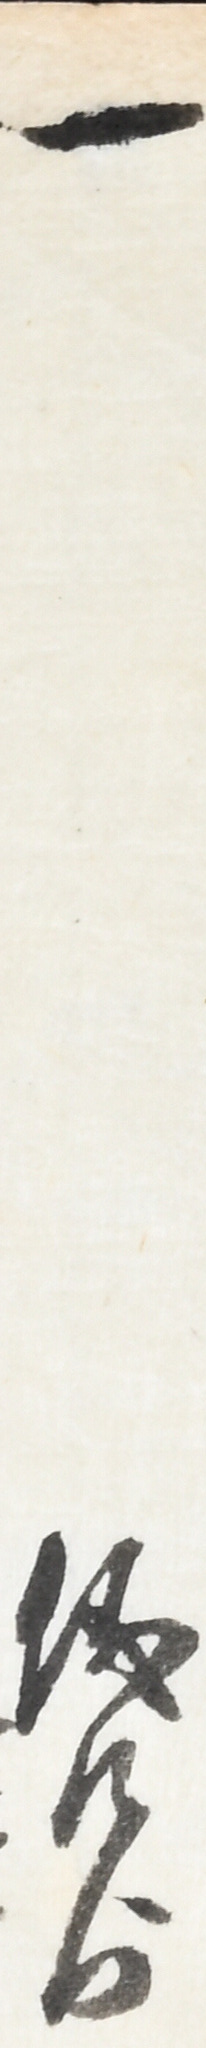一儀左衛門

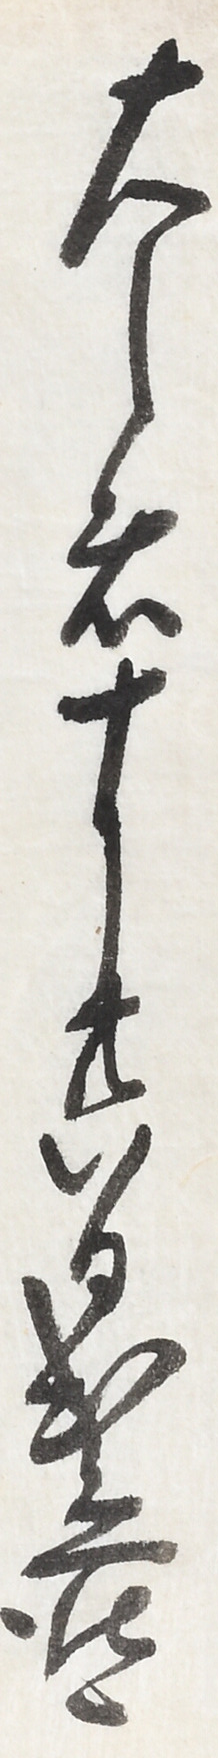右之者十月廿八日出立仕候
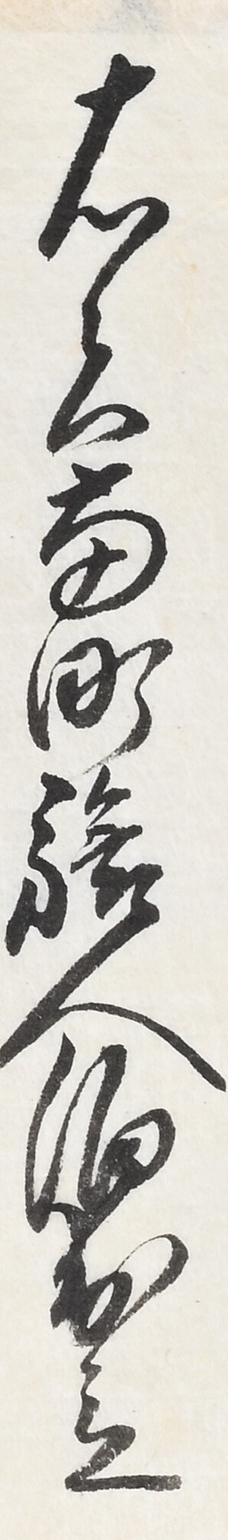右者当町旅人泊出立
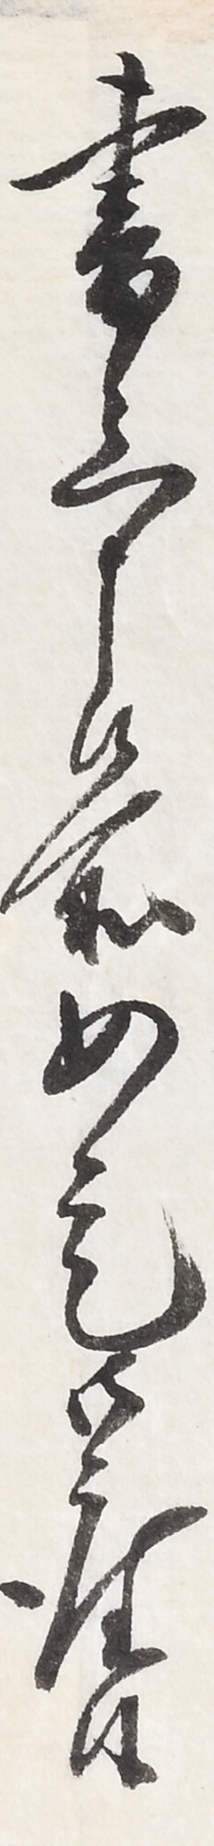書上申候所如是御座候
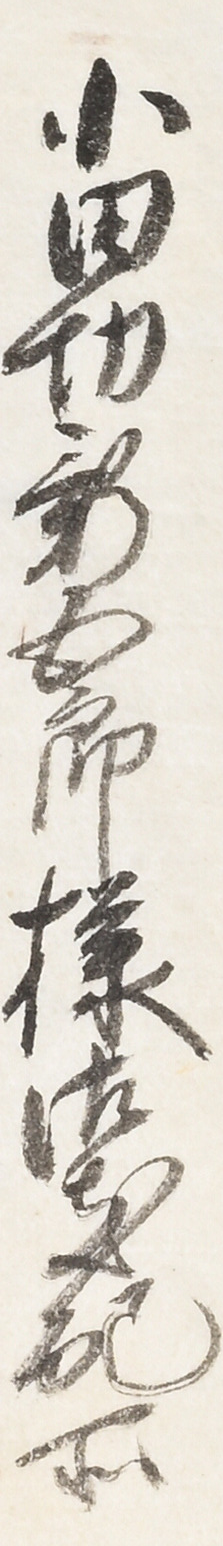小田切新五郎様御支配所
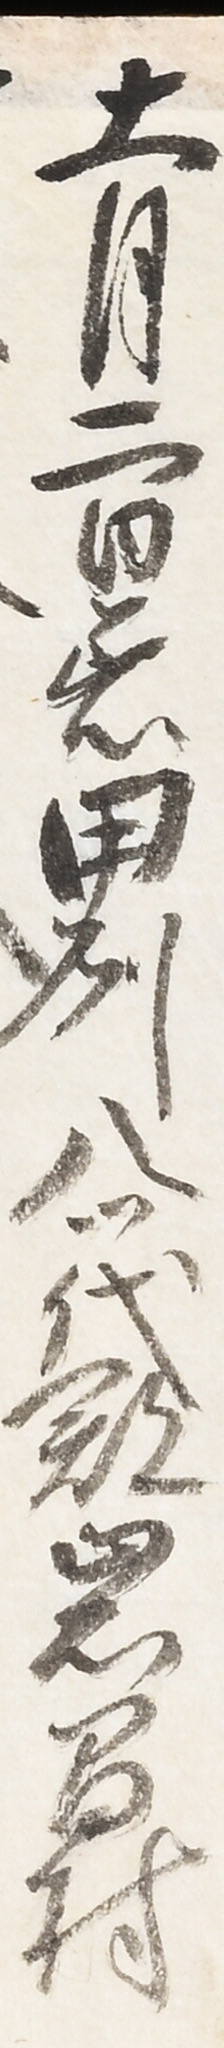十一月二日着甲州八ツ代郡岩間村
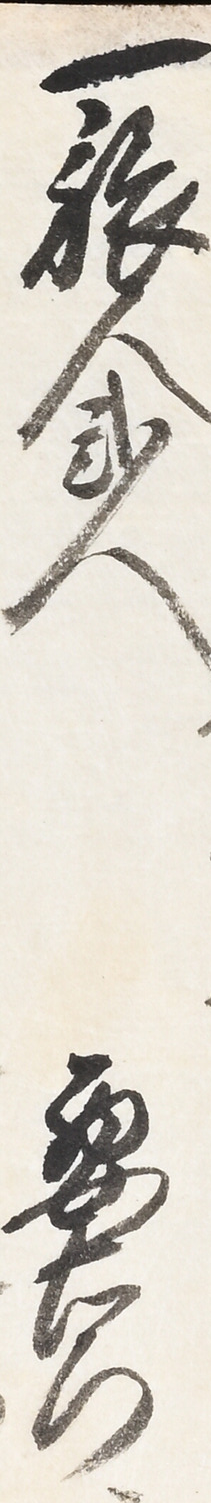一旅人弐人要右衛門、
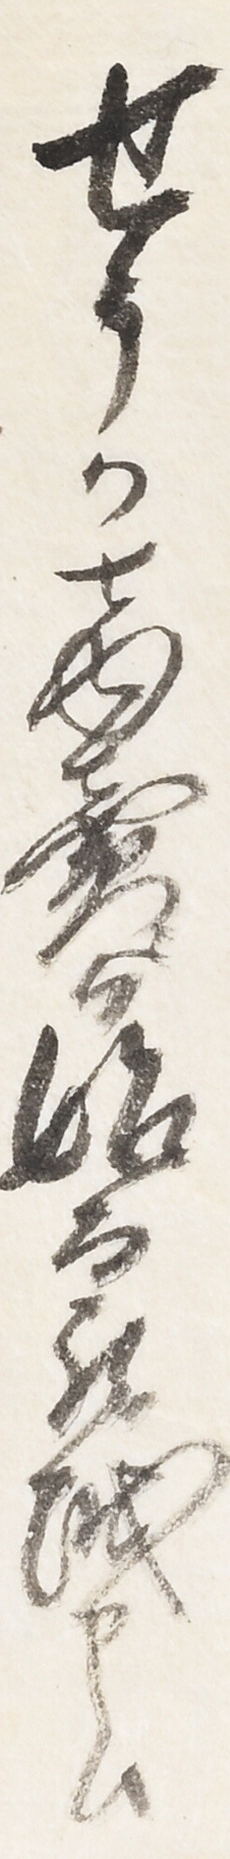せうか商売ニ而始而罷越申候
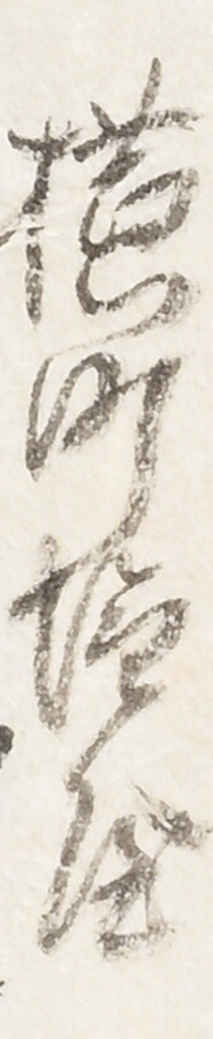横町塩屋
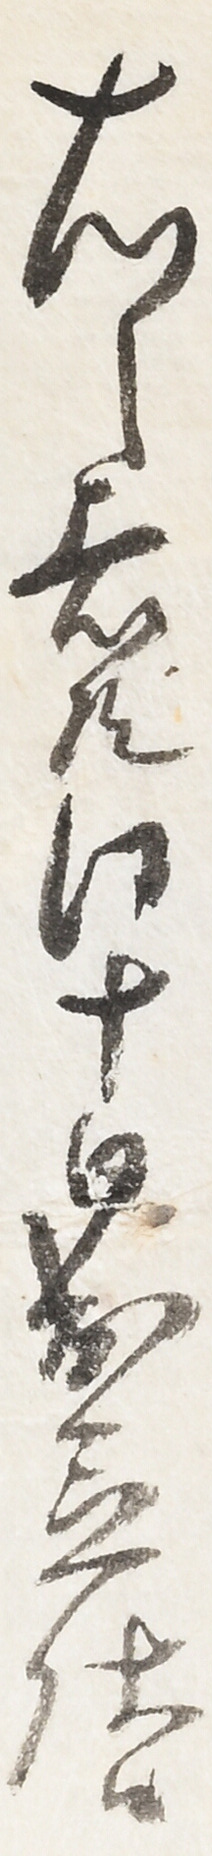右之者共同十日出立仕候
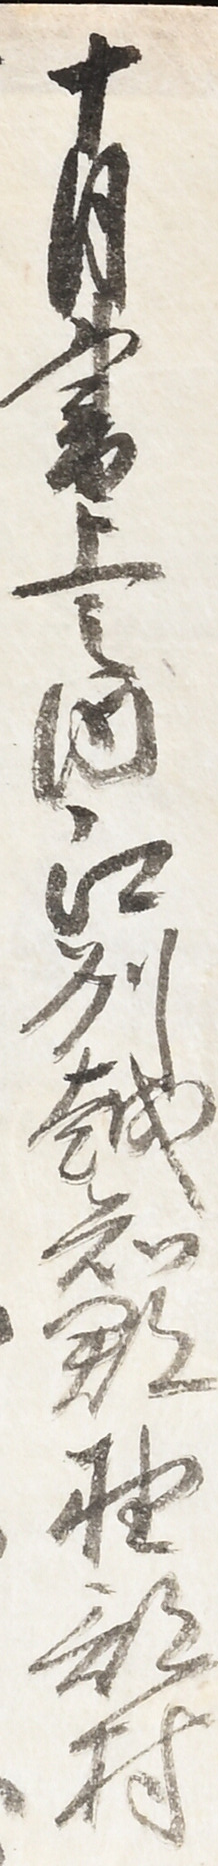十月書上之内江州越知郡野部村
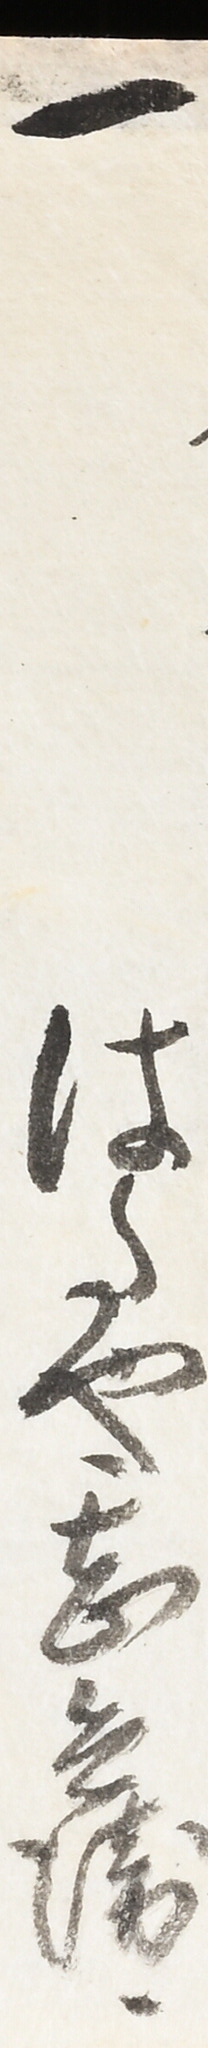一はたや甚兵衛・
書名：旅人泊控帳
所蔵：伊那市立高遠町図書館・合同会社AMANE
